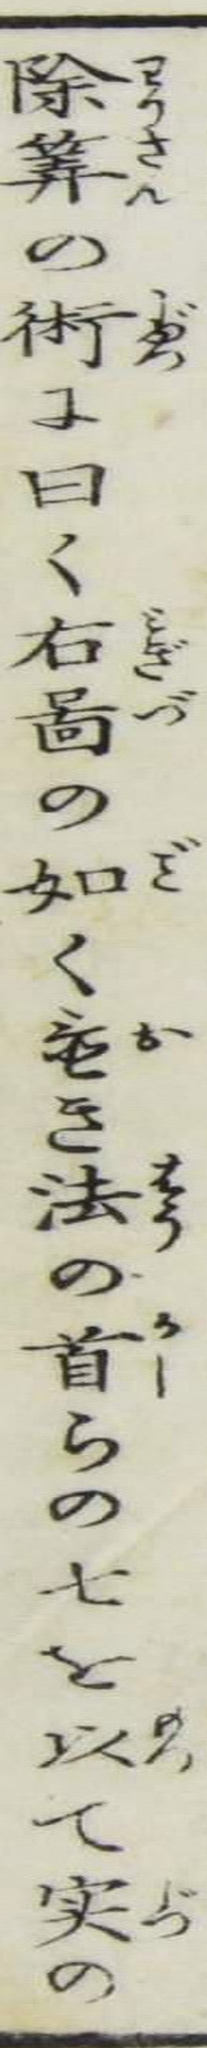除算の術に曰く右図の如く置き法の首らの七を以て実の

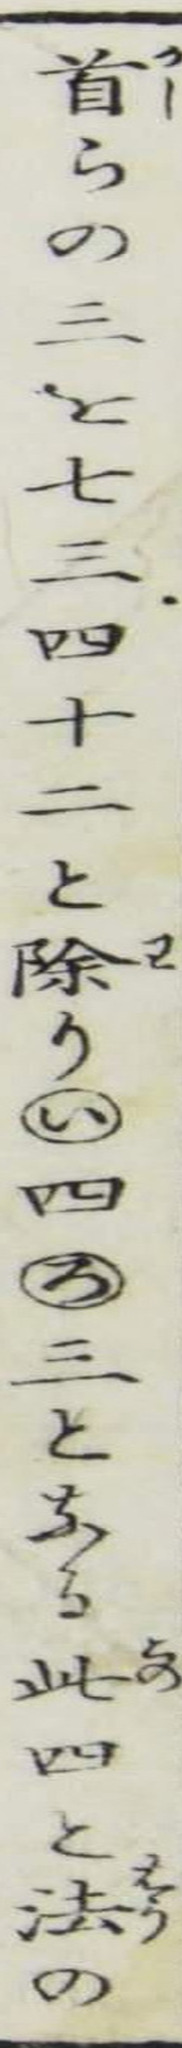首らの三を七三．四十二と除り㋑四㋺三となる此四と法の
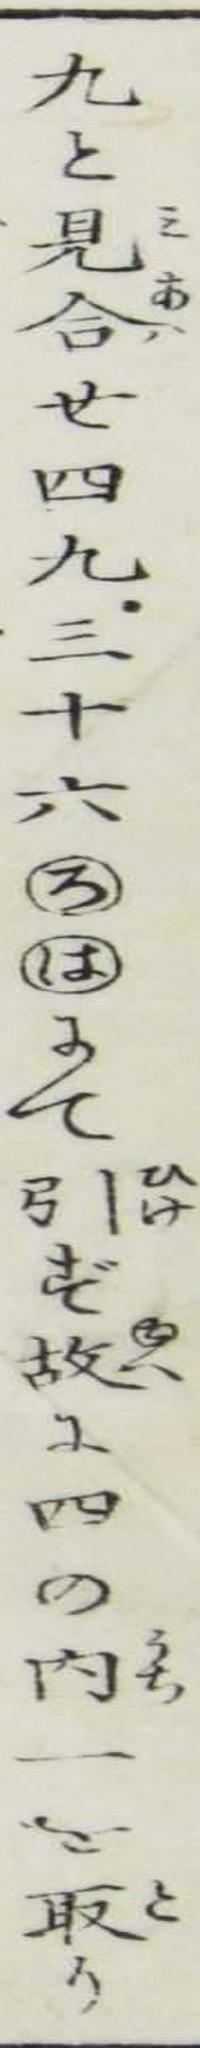九と見合せ四九．三十六㋺㋩にて引ず故に四の内一を取り
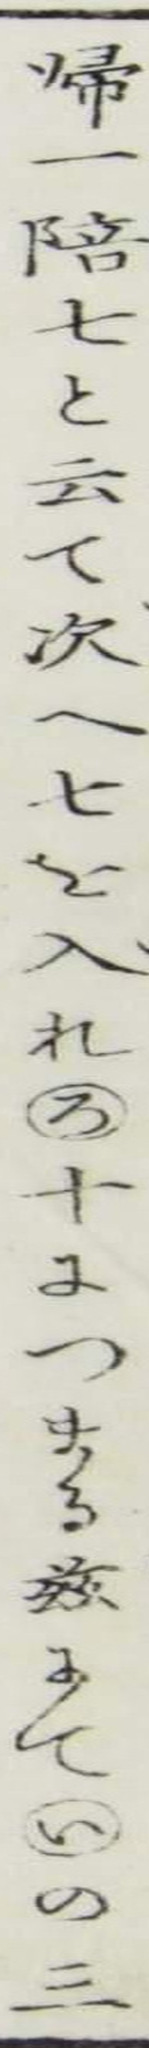帰一賠七と云て次へ七を入れ㋺十につまる兹にて㋑の三
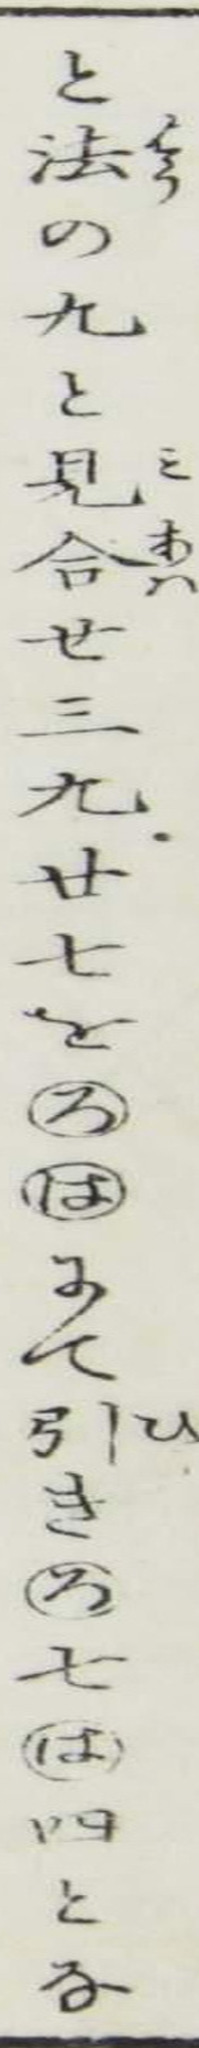と法の九と見合せ三九．廿七を㋺㋩にて引き㋺七㋩四とな
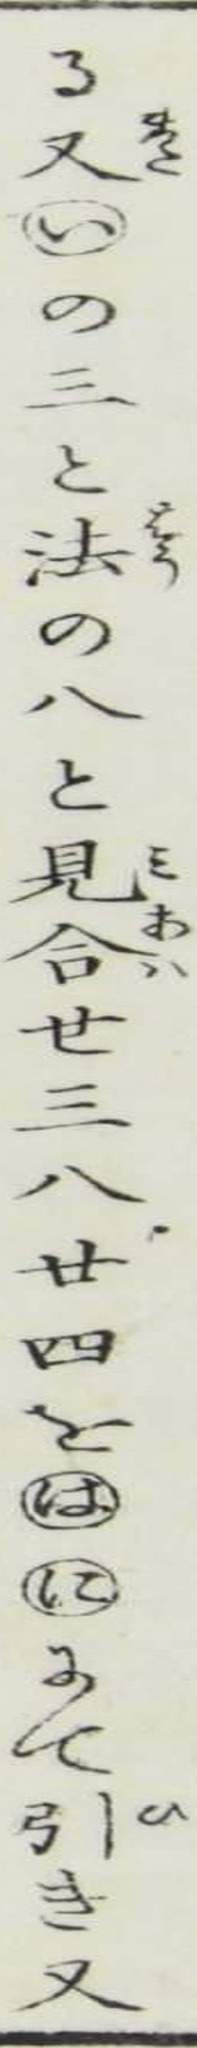る又㋑の三と法の八と見合せ三八．廿四を㋩㋥にて引き又
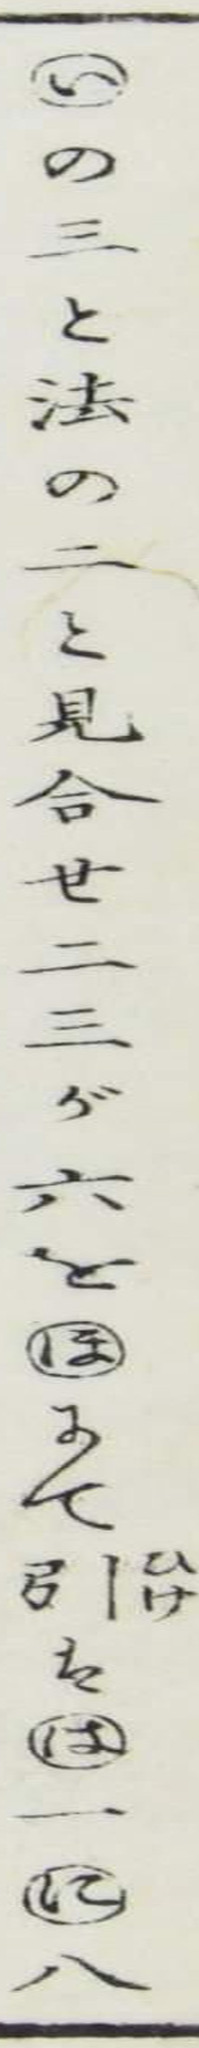㋑の三と法の二と見合せ二三が六を㋭にて引は㋩一㋥八
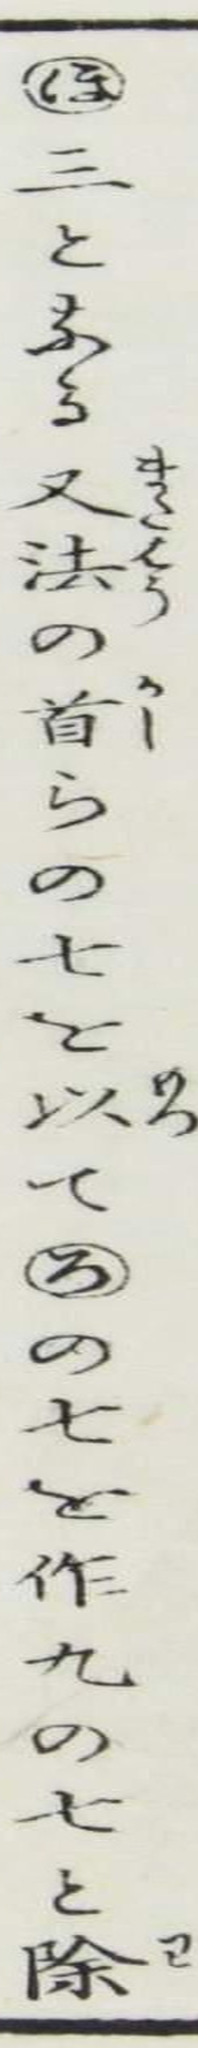㋭三となる又法の首らの七を以て㋺の七を作九の七と除
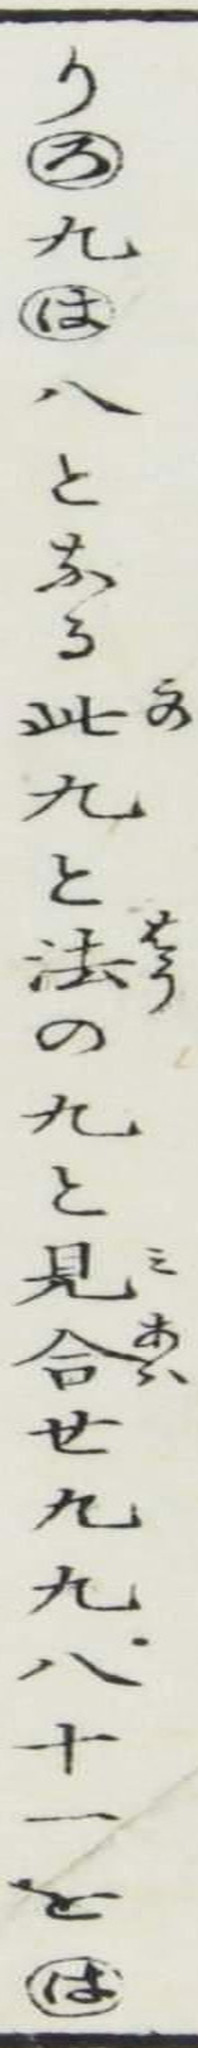り㋺九㋩八となる此九と法の九と見合せ九九．八一を㋩
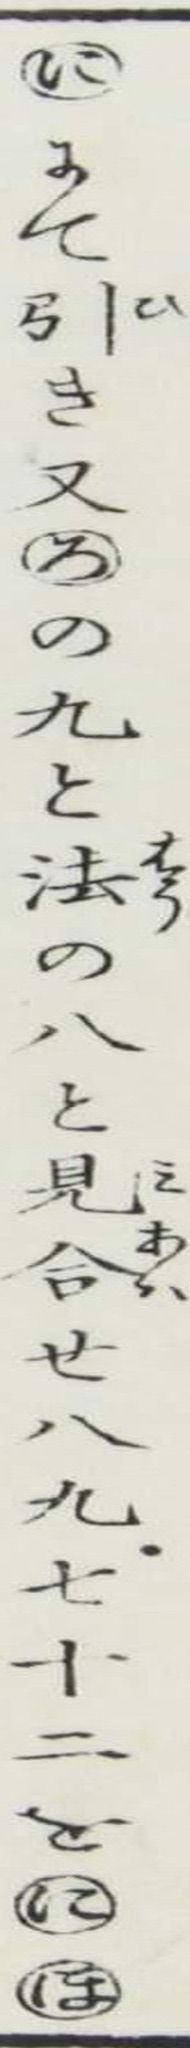㋥にて引き又㋺の九と法の八と見合せ八九．七十二を㋥㋭
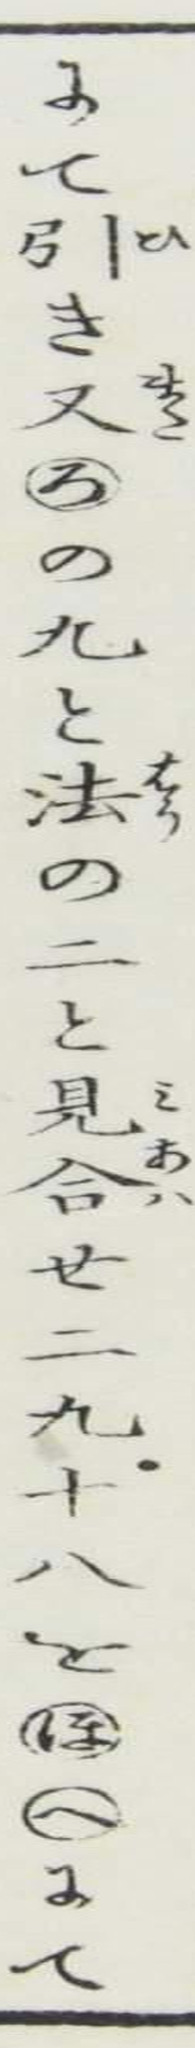にて引き又㋺の九と法の二と見合せ二九．十八を㋭㋬にて
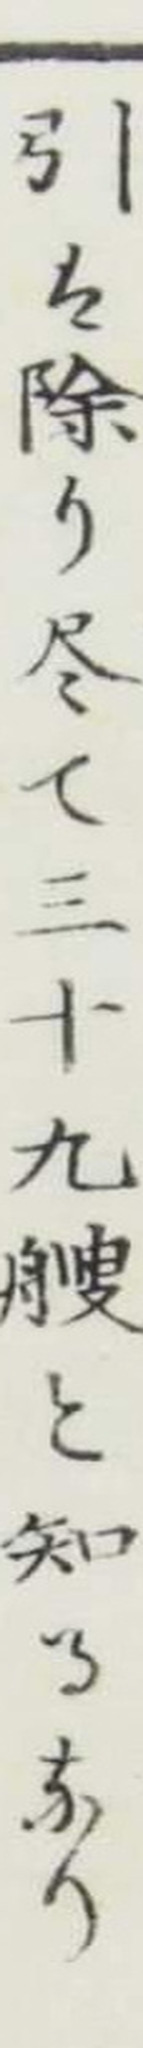引は除り尽て三十九艘と知るなり
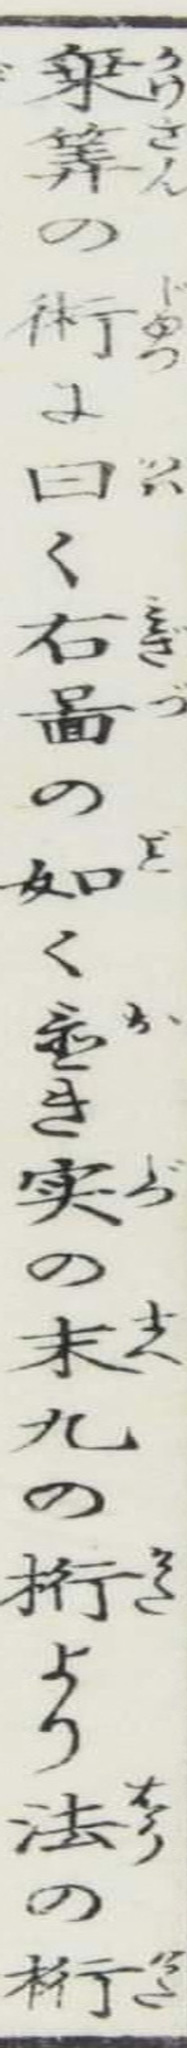乗算の術に曰く右図の如く置き実の末九の桁より法の桁
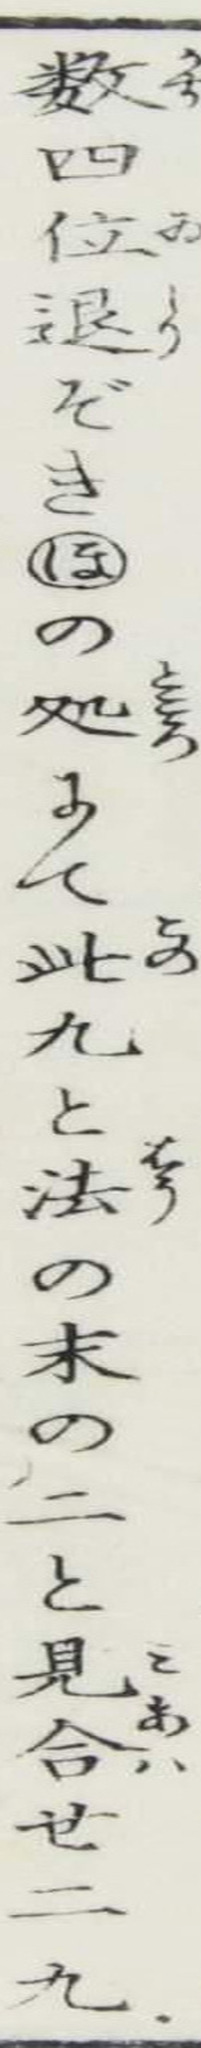数四位退ぞき㋭の処にて此九と法の末の二と見合せ二九．
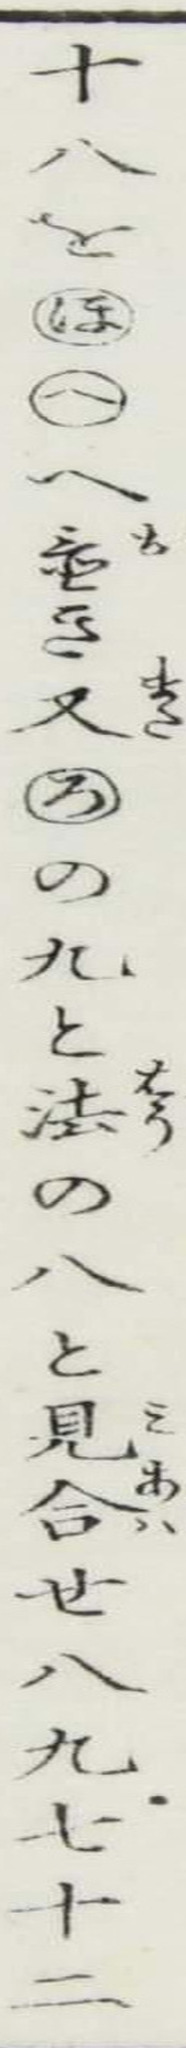十八を㋭㋬へ置き又㋺の九と法の八と見合せ八九．七十二
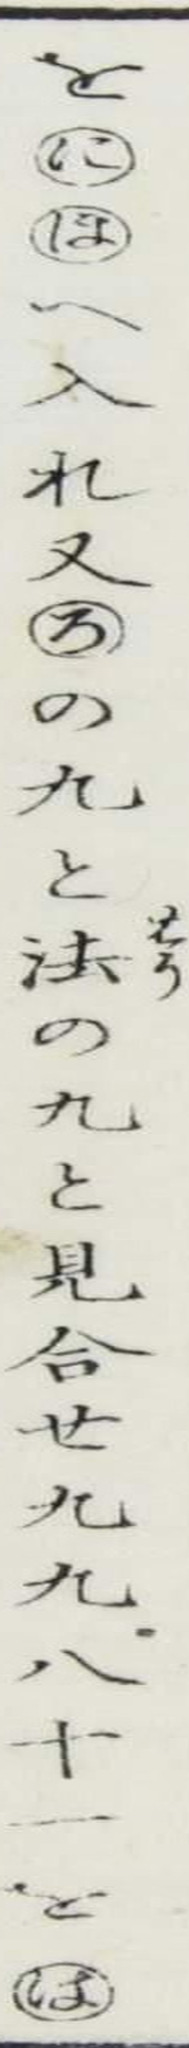を㋥㋭へ入れ又㋺の九と法の九と見合せ九九．八十一を㋩
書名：明治小學塵劫記 卷1
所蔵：東京学芸大学教育コンテンツアーカイブ
